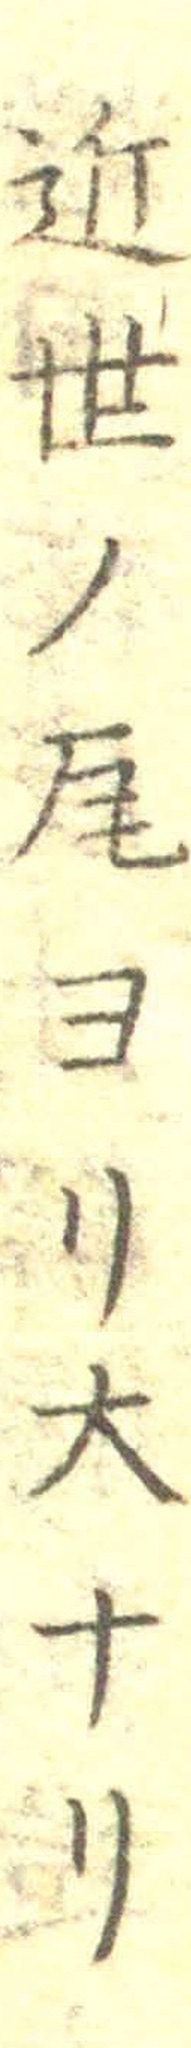近世ノ瓦ヨリ大ナリ
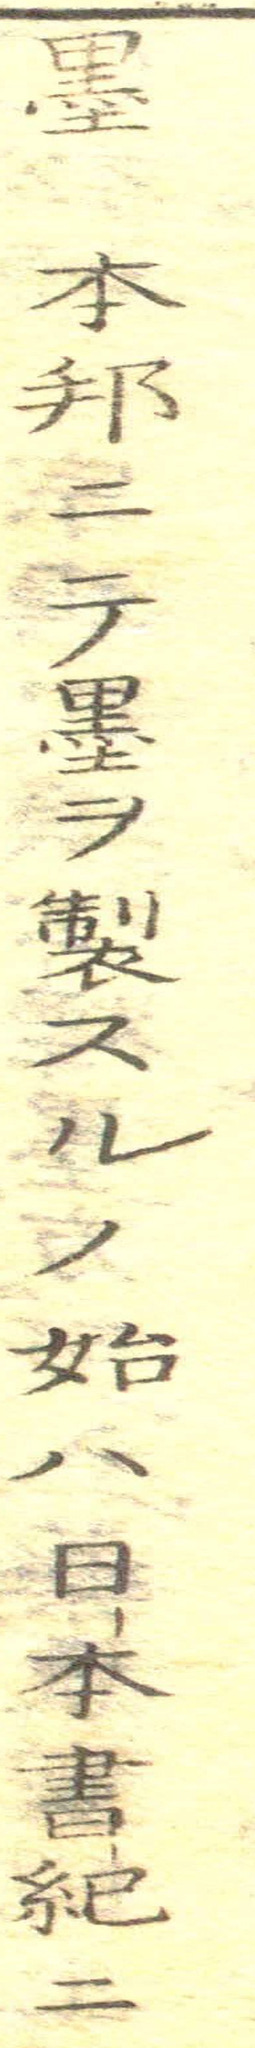墨本邦ニテ墨ヲ製スルノ始ハ日-本書-紀ニ
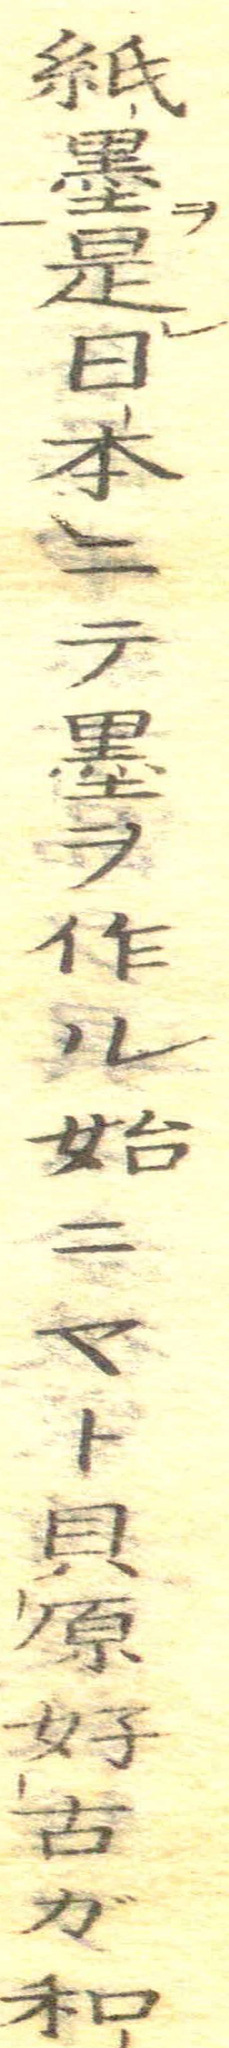紙-墨是墨ヲ作ル始ニヤト貝-原好-古ガ和-

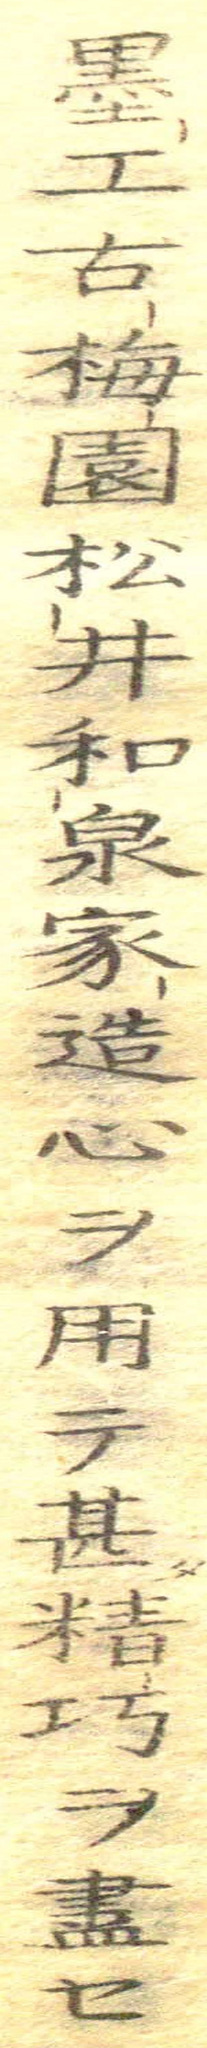墨-工古-梅-園松-井和-泉家-造心ヲ用テ甚精-巧ヲ尽セ
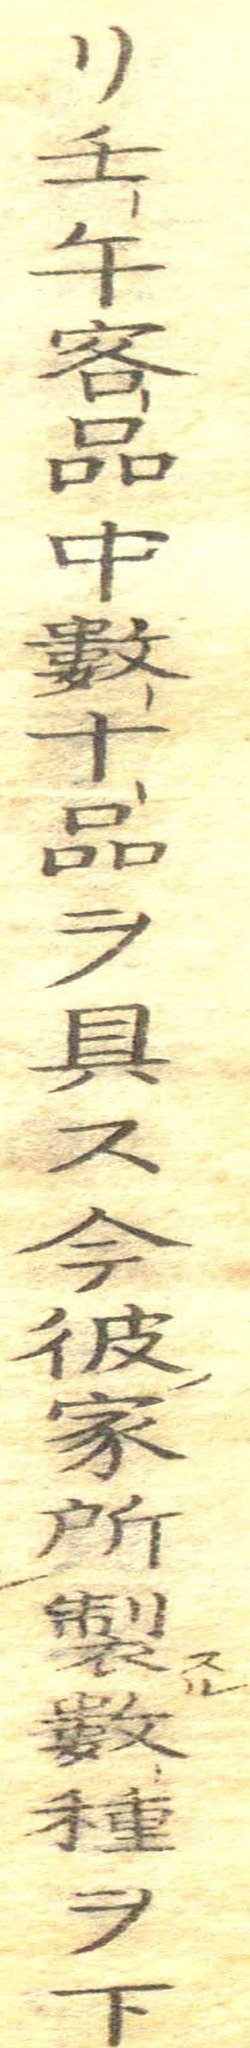リ壬-午客-品中数十-品ヲ具ス今彼家所製数種ヲ下
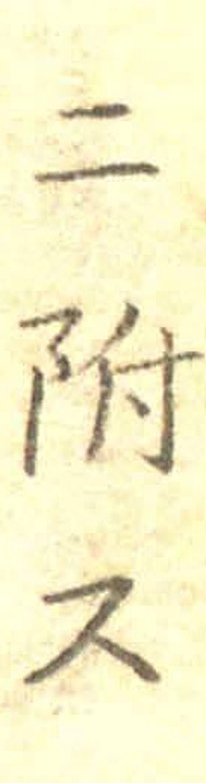二附ス
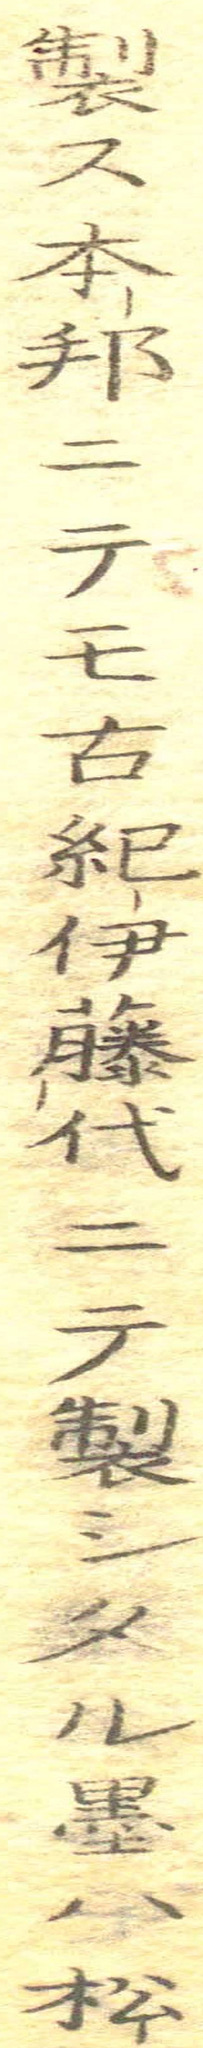製ス本-邦ニテモ古紀-伊藤-代ニテ製シタル墨ハ松-
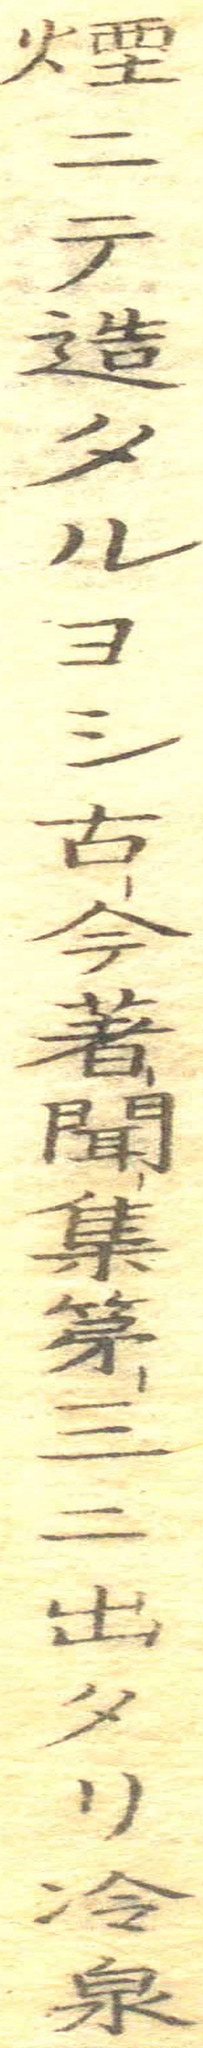煙ニテ造タルヨシ古-今著-聞-集第-三ニ出タリ冷泉
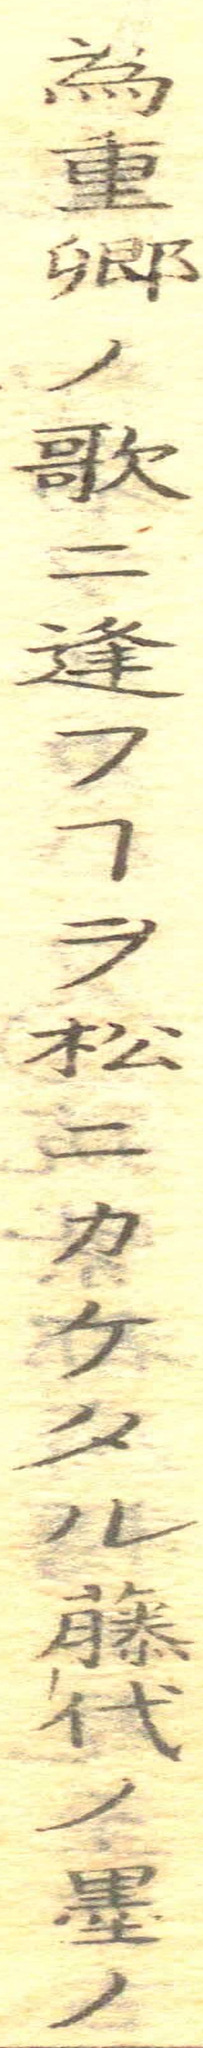為重卿ノ歌ニ逢フコトヲ松ニカケタル藤代ノ墨ノ
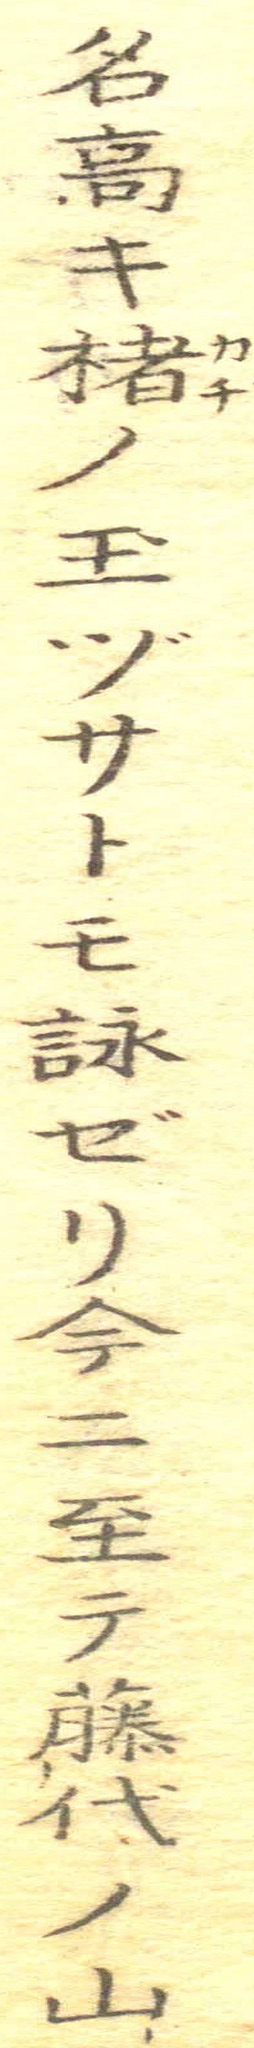名高キ楮ノ玉ヅサトモ詠ゼリ今ニ至テ藤-代ノ山-
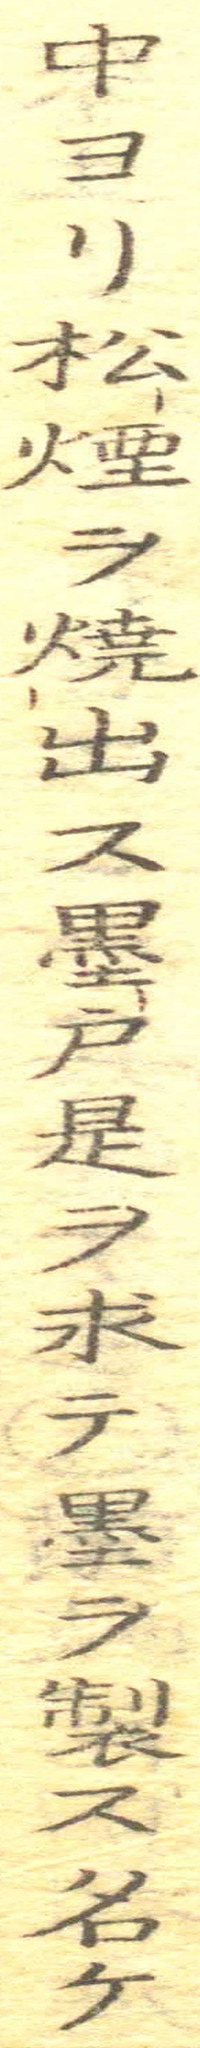中ヨリ松-煙ヲ焼-出ス墨-戸是ヲ求テ墨ヲ製ス名ケ
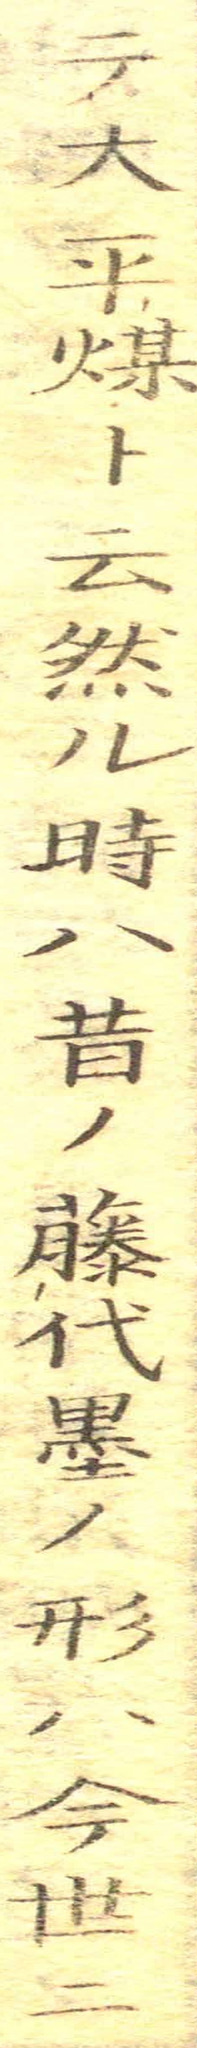テ大平-煤ト云然ル時ハ昔ノ藤-代墨ノ形ハ今世ニ
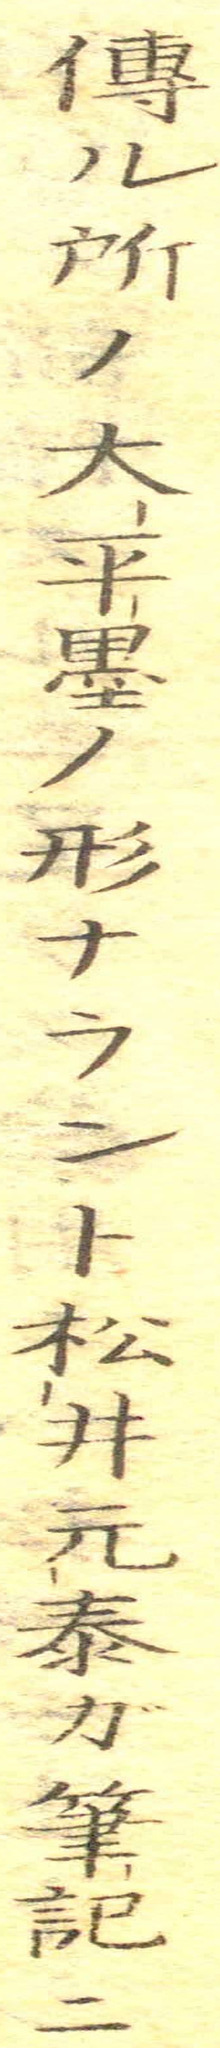伝ル所ノ大-平-墨ノ形ナラント松-井元泰ガ筆-記ニ
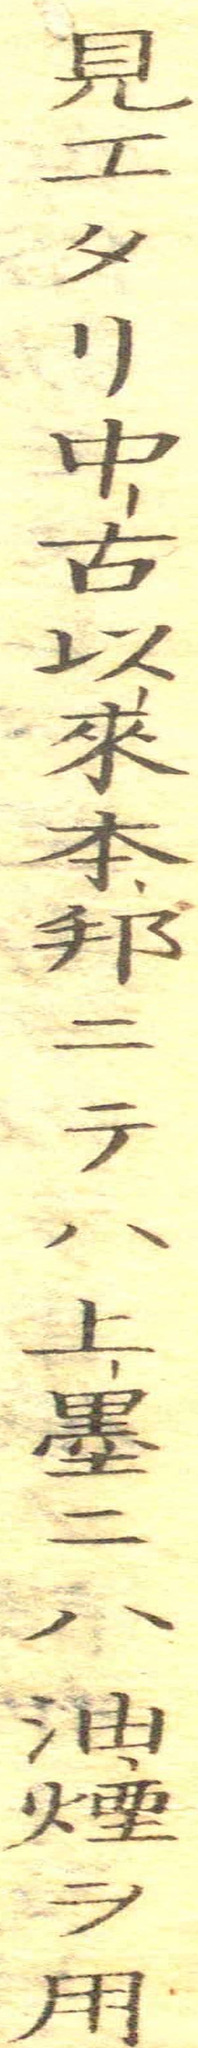見エタリ中-古以-来本-邦ニテハ上-墨ニハ油-煙ヲ用
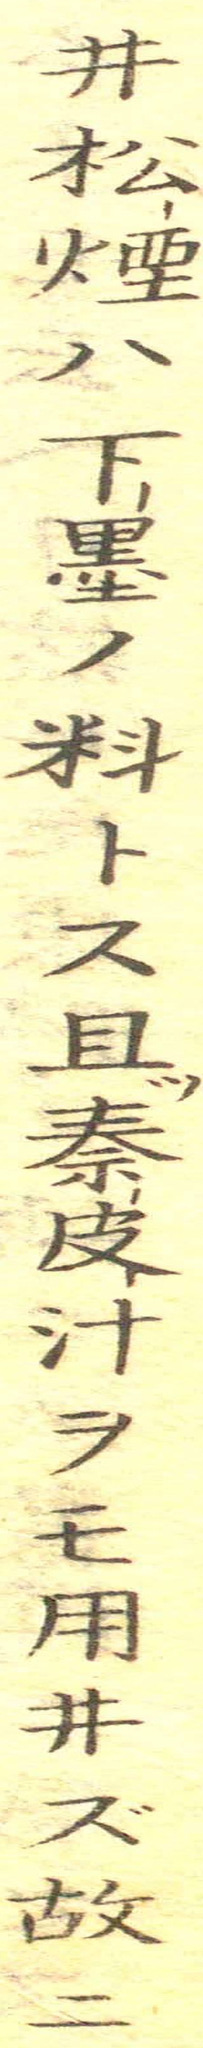ヰ松-煙ハ下-墨ノ料トス且秦-皮-汁ヲモ用ヰズ故ニ
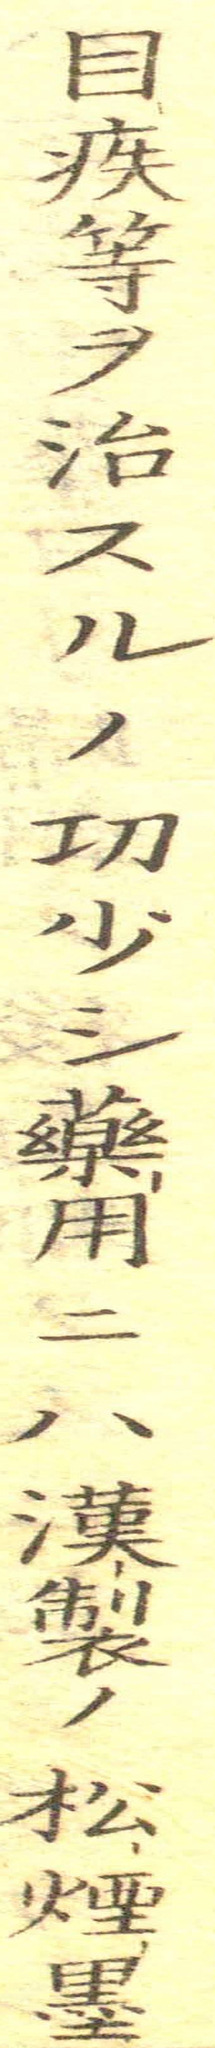目-疾等ヲ治スルノ功少シ薬-用ニハ漢-製ノ松-煙-墨
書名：物類品隲
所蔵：国文学研究資料館
